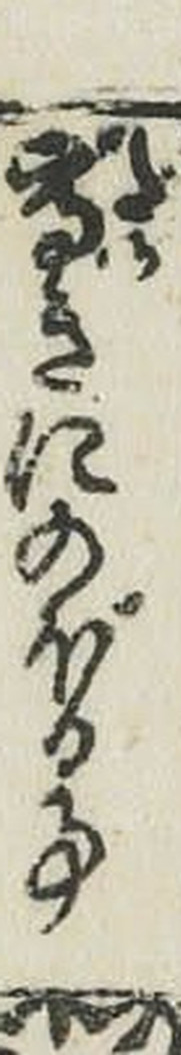高きにのぼる事
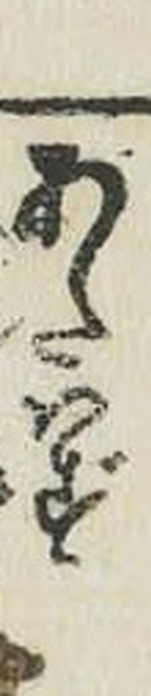あたはず
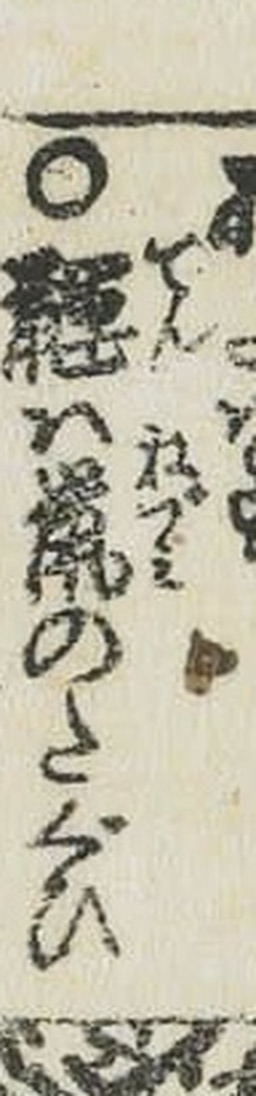○貂は鼠のたぐひ
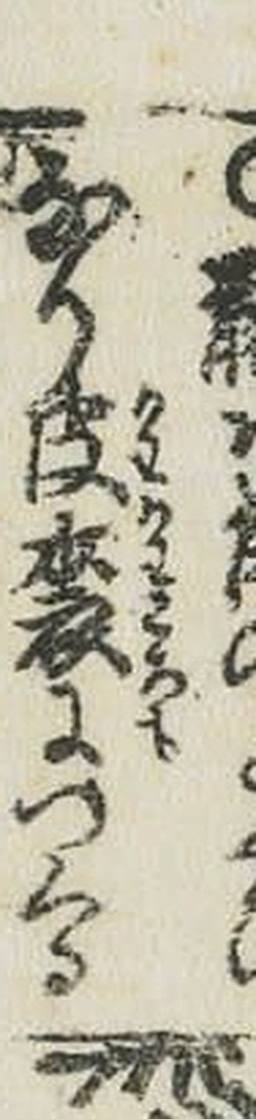なり皮裘につくる
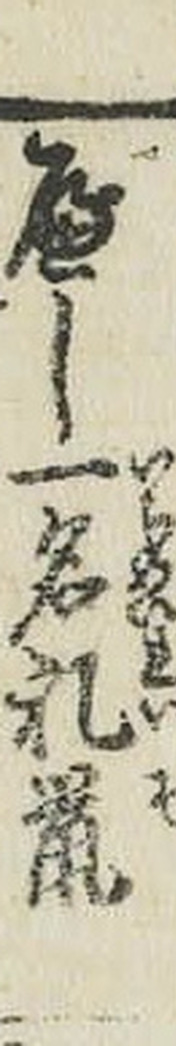べし一名礼鼠
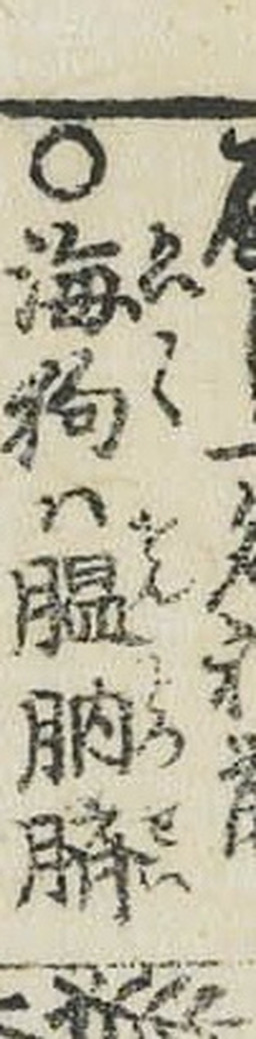○海狗は膃肭臍
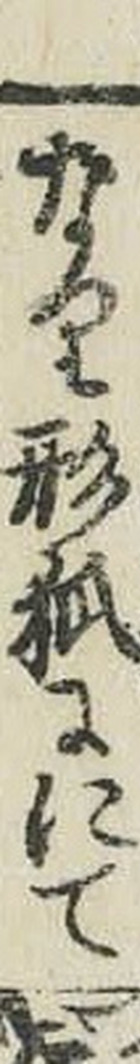なり形狐ににて
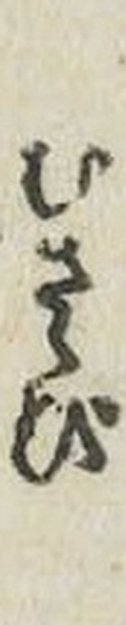むさゝび
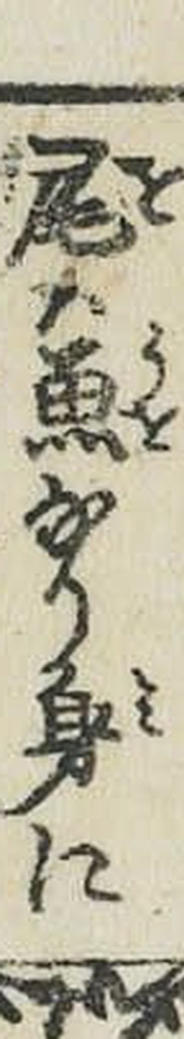尾は魚なり身に
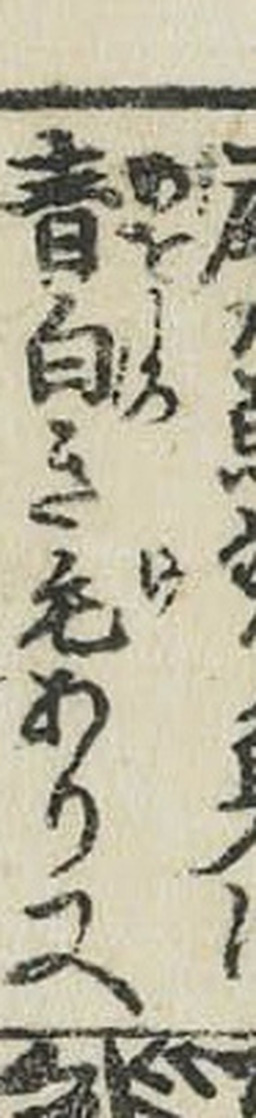青白き毛あり又
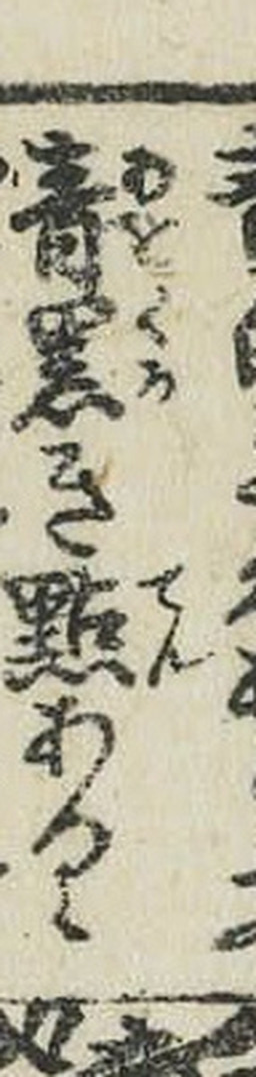青黒き点あり
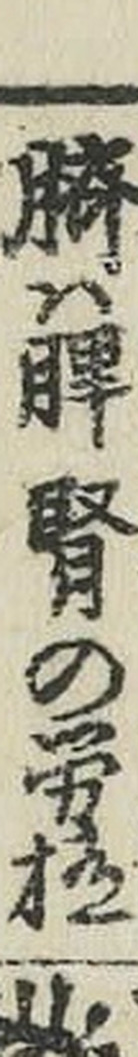臍は脾腎の労極
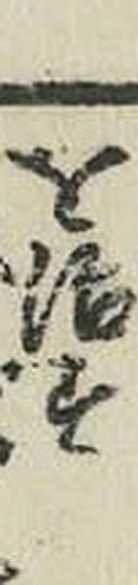を治す
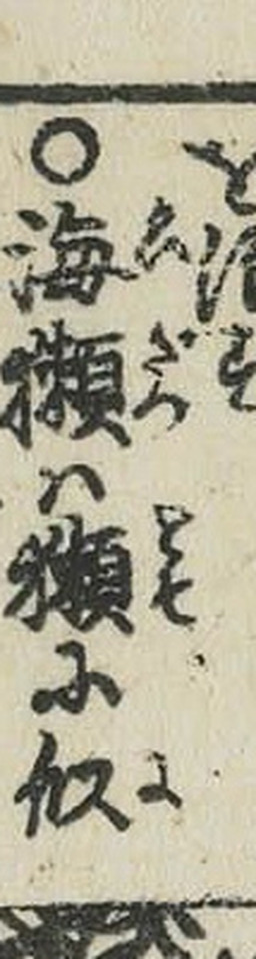○海獺は獺に似
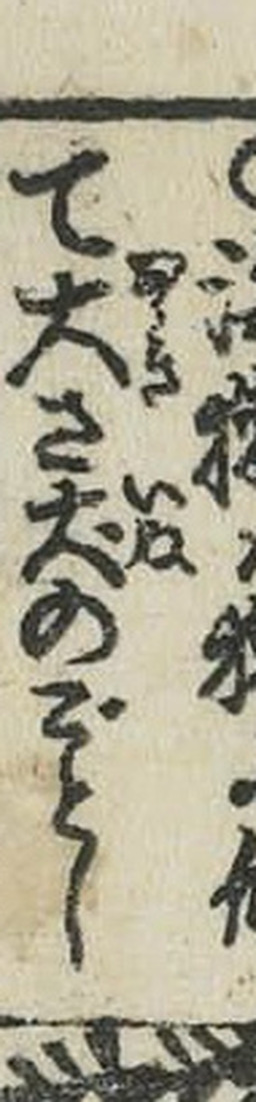て大さ犬のごとし

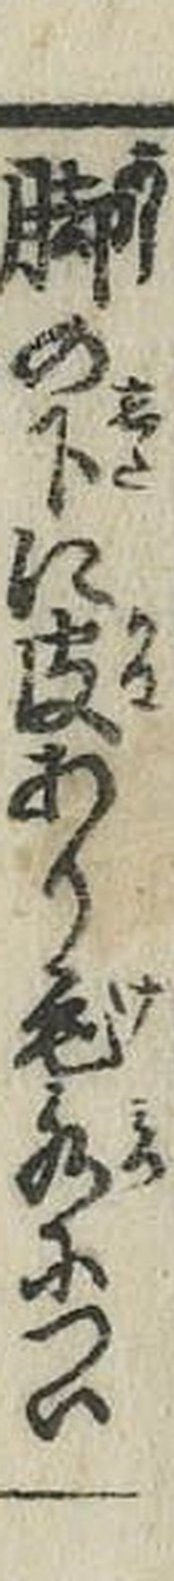脚の下に皮あり毛水につい
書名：増補頭書訓蒙図彙大成 10巻 6:巻之12-13
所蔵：東京学芸大学教育コンテンツアーカイブ
